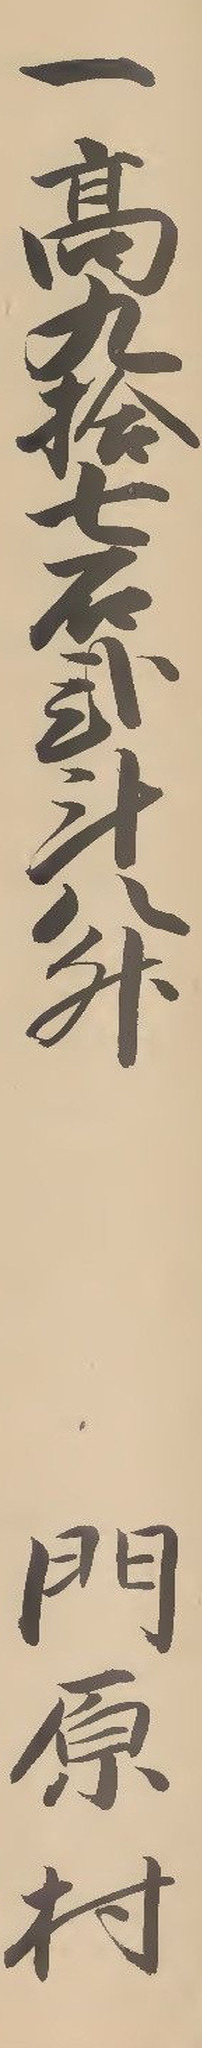一高九拾七石弐斗八升門原村
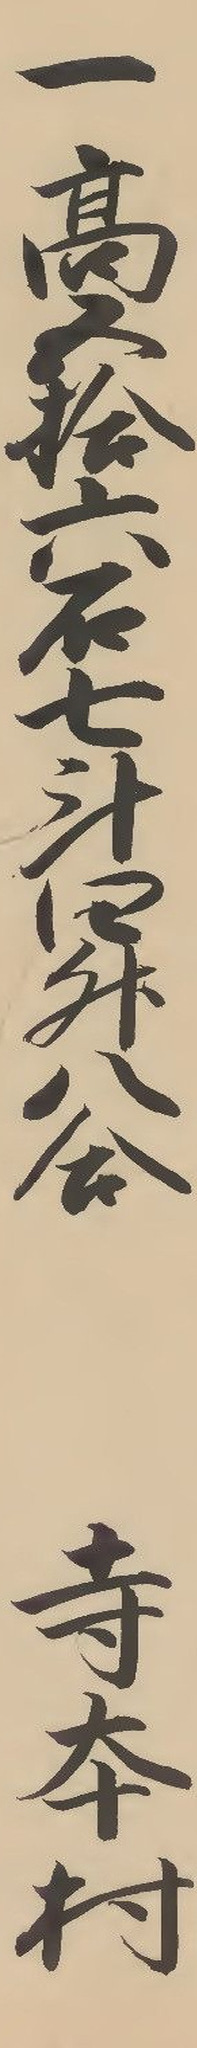一高五拾六石七斗四升八合寺本村
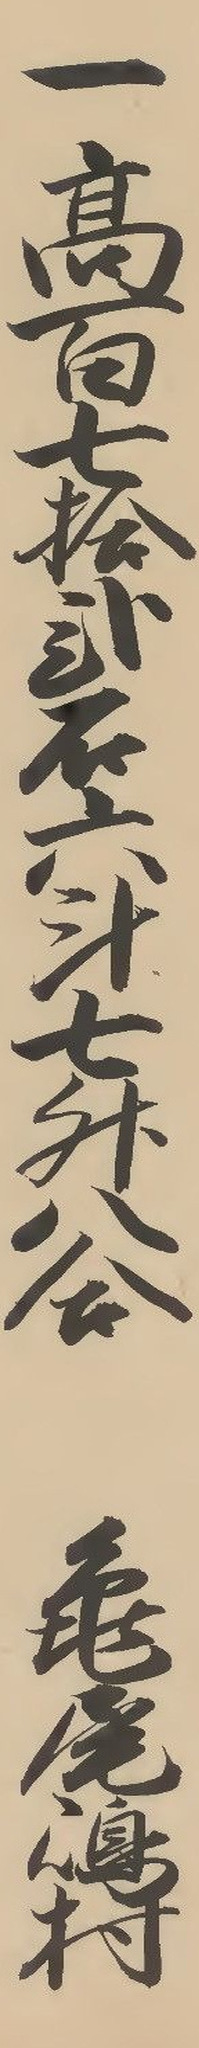一高百七拾弐石六斗七升八合亀尾島村
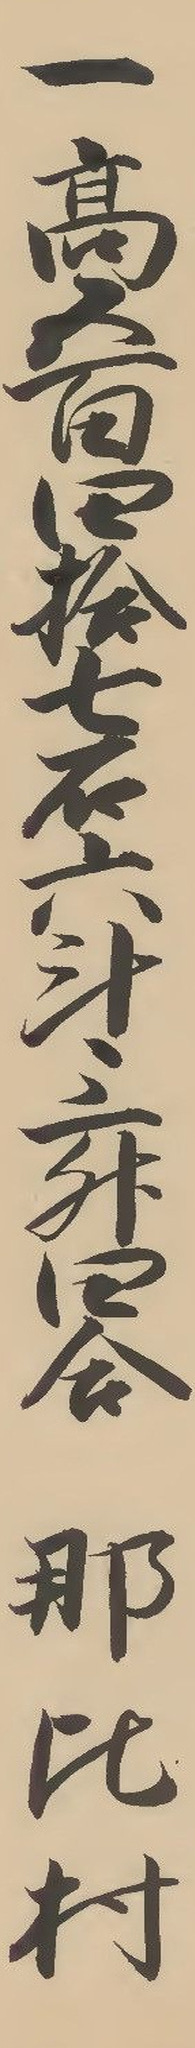一高五百四拾七石六斗三升四合那比村

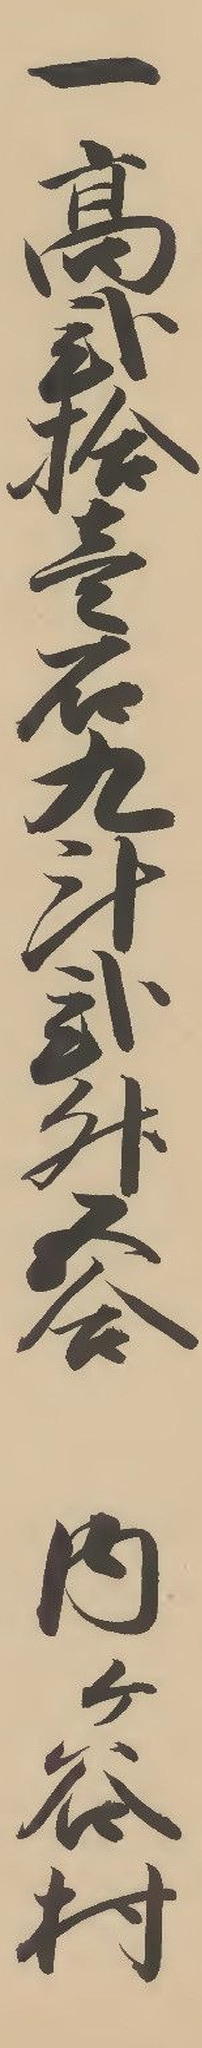一高弐拾壱石九斗弐升五合内ヶ谷村
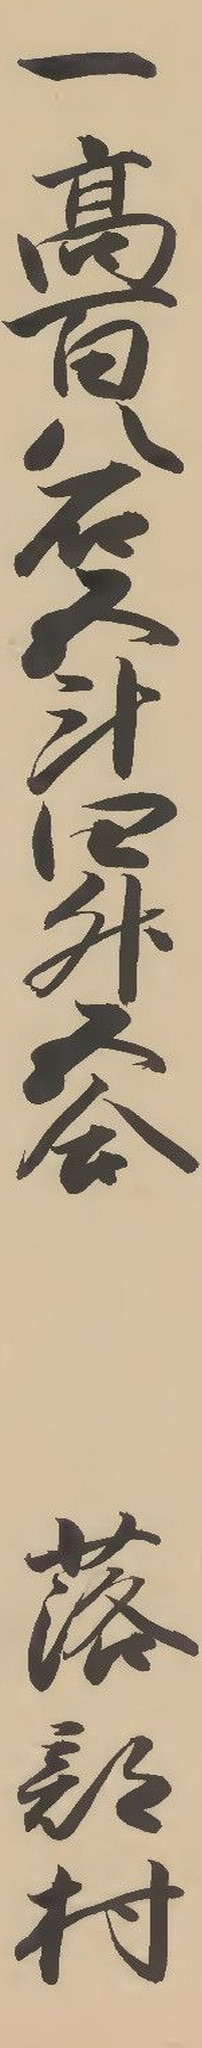一高百八石五斗四升五合落部村
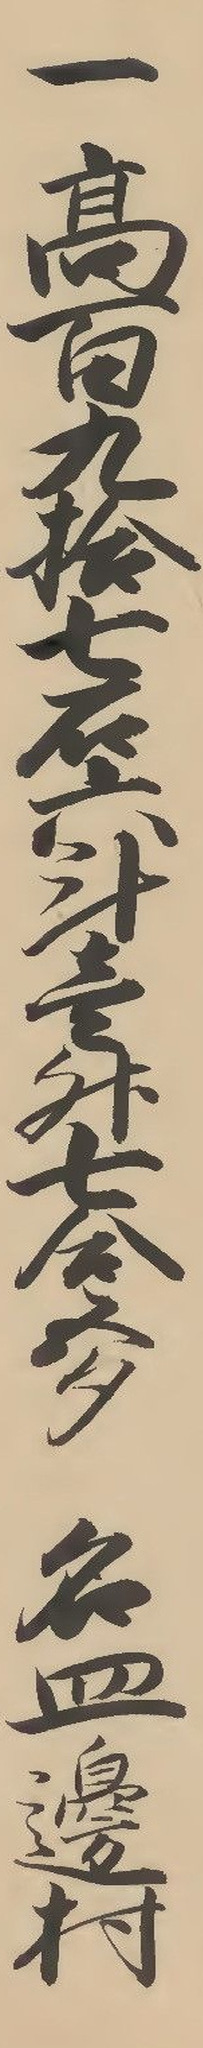一高百九拾七石六斗壱升七合五勺名皿辺村
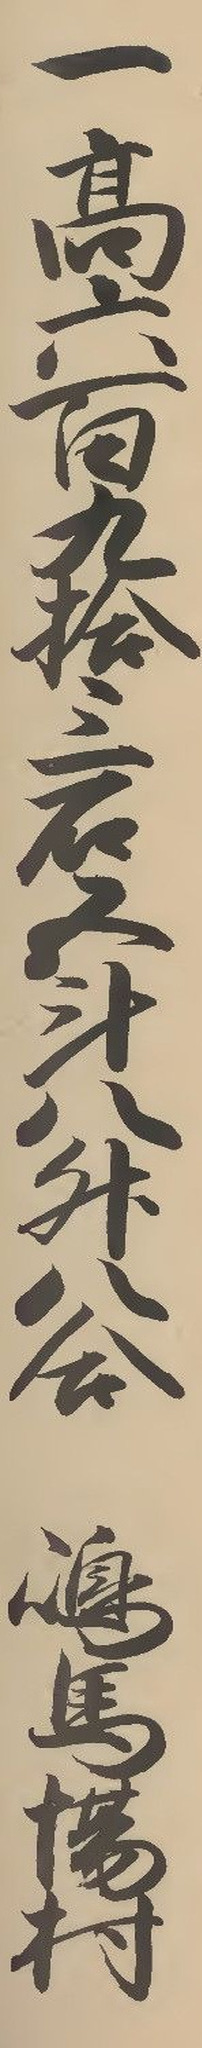一高六百九拾三石五斗八升八合島馬場村
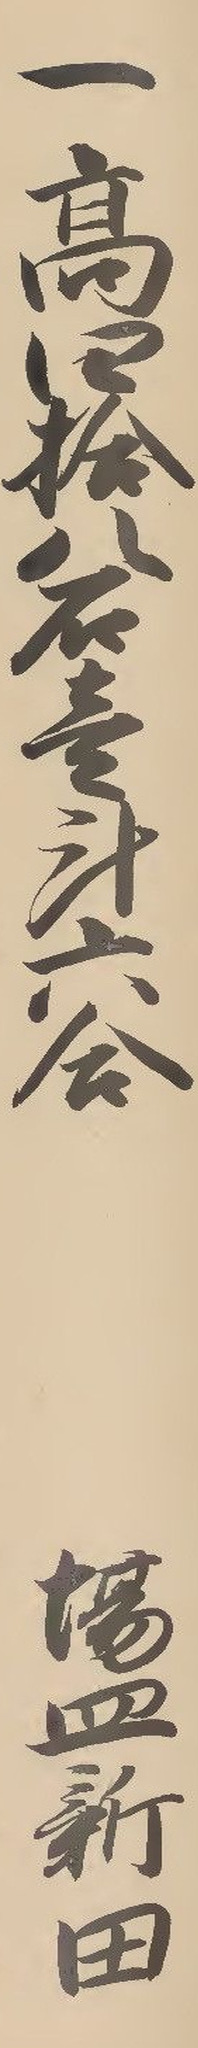一高四拾八石壱斗六合場皿新田
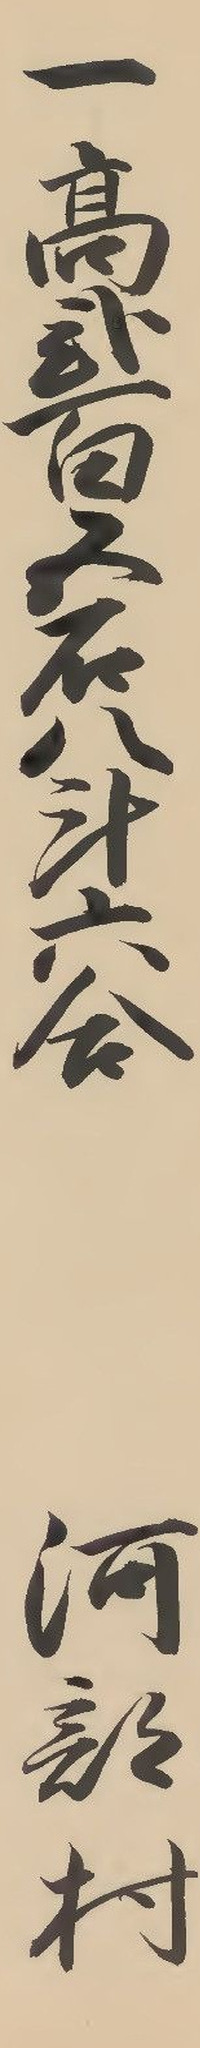一高弐百五石八斗六合河部村
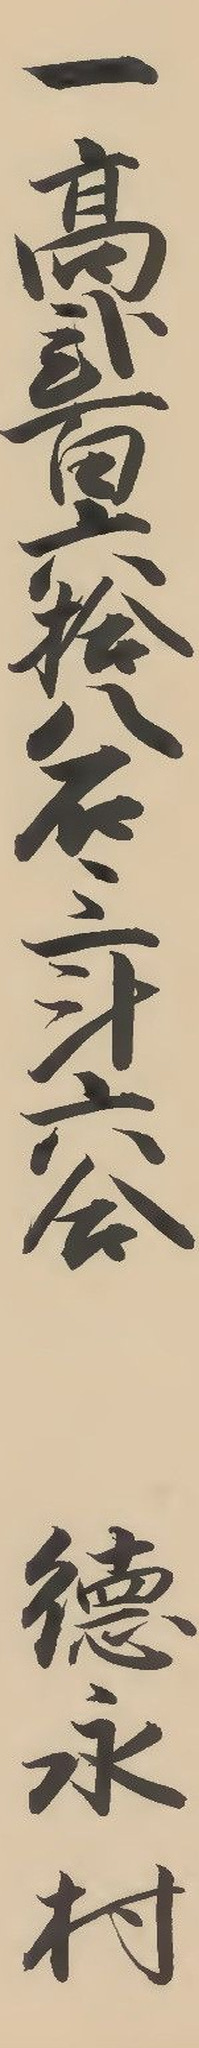一高弐百六拾八石三斗六合徳永村
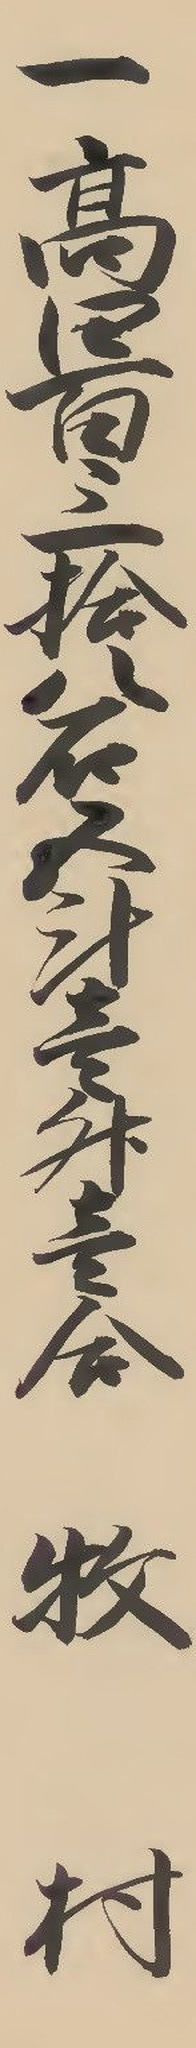一高四百三拾八石五斗壱升壱合牧村

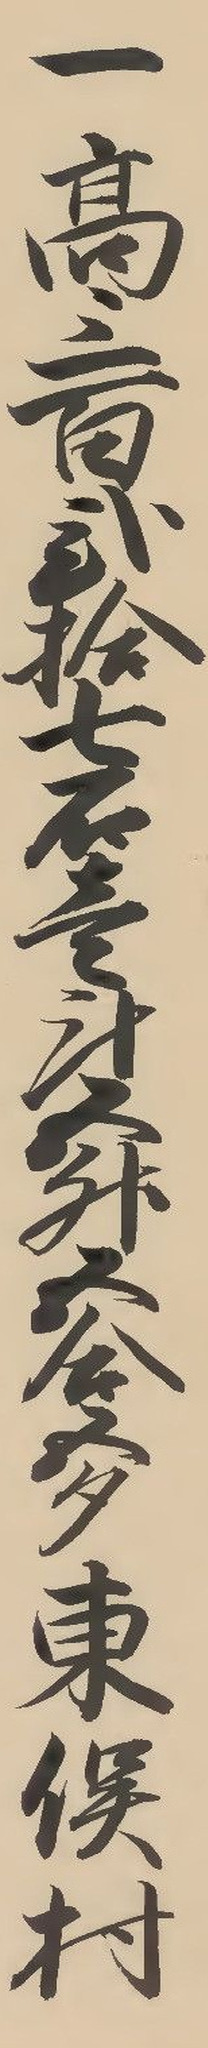一高三百弐拾七石壱斗五升五合五勺東俣村
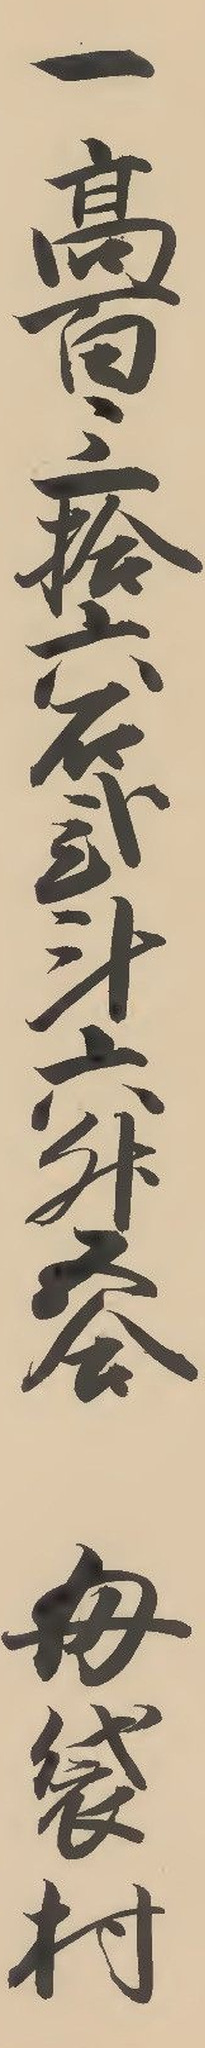一高百三拾六石弐斗六升五合母袋村
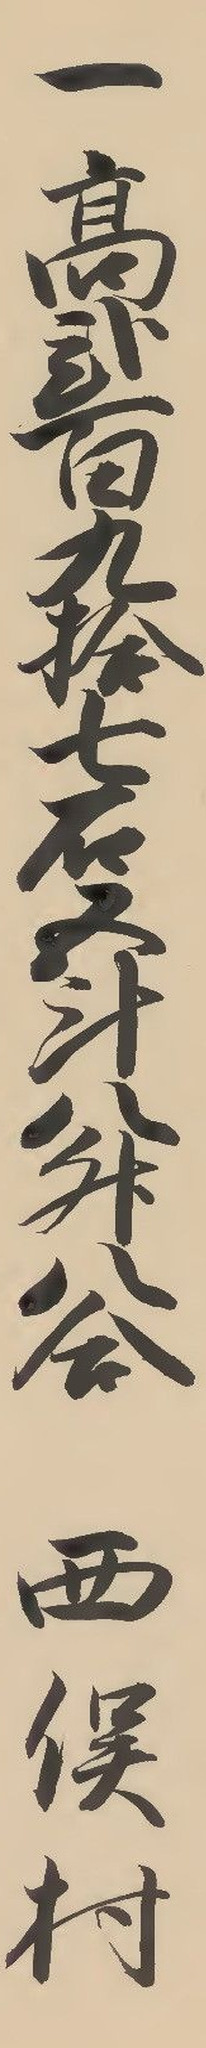一高弐百九拾七石五斗八升八合西俣村
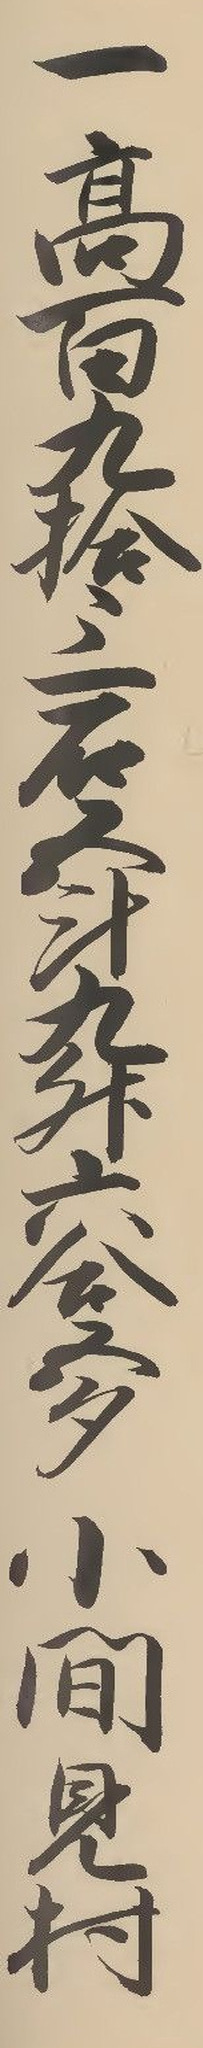一高百九拾三石五斗九升六合五勺小間見村
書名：美濃国郷帳
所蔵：国立公文書館 National Archives of Japan
